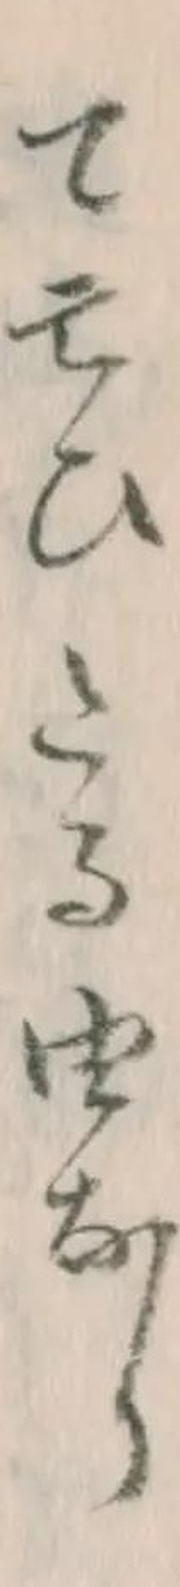て亡ひたる由なり
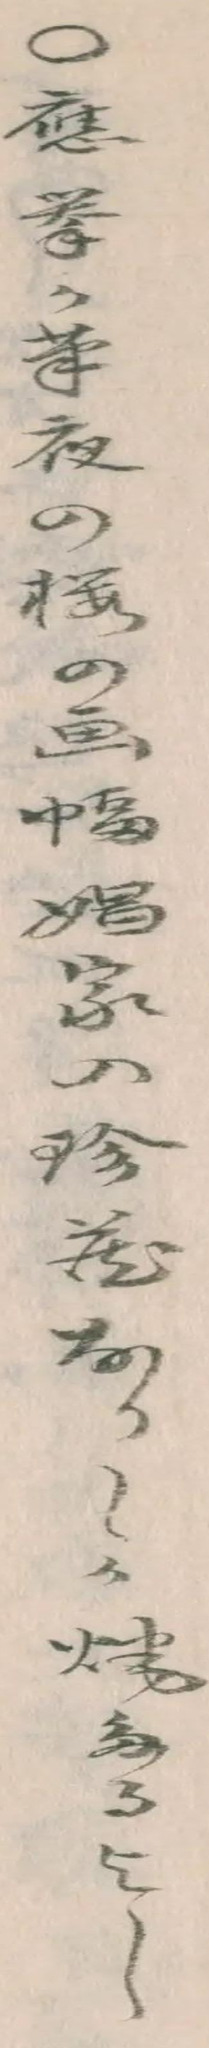〇応挙か筆夜の桜の画幅娼家の珍蔵なりしか焼たるよし
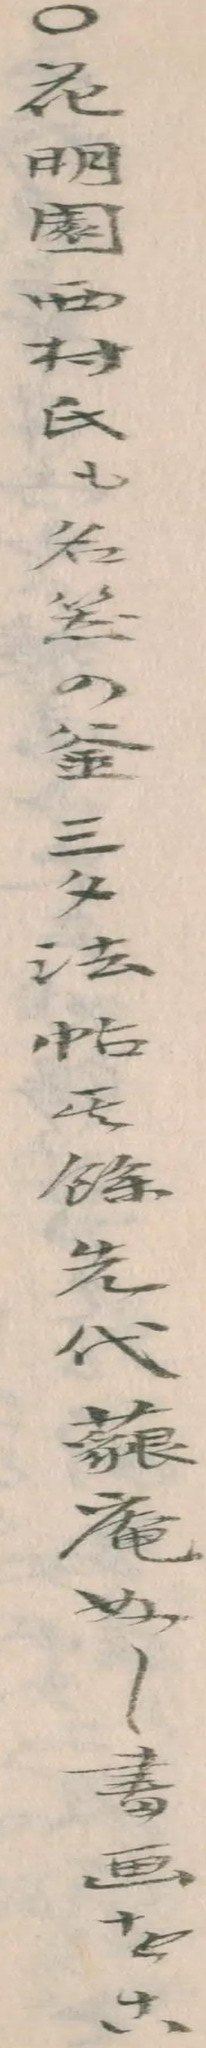〇花明園西村氏も名器の釜三タ法帖其余先代藐庵ぬし書画をこ
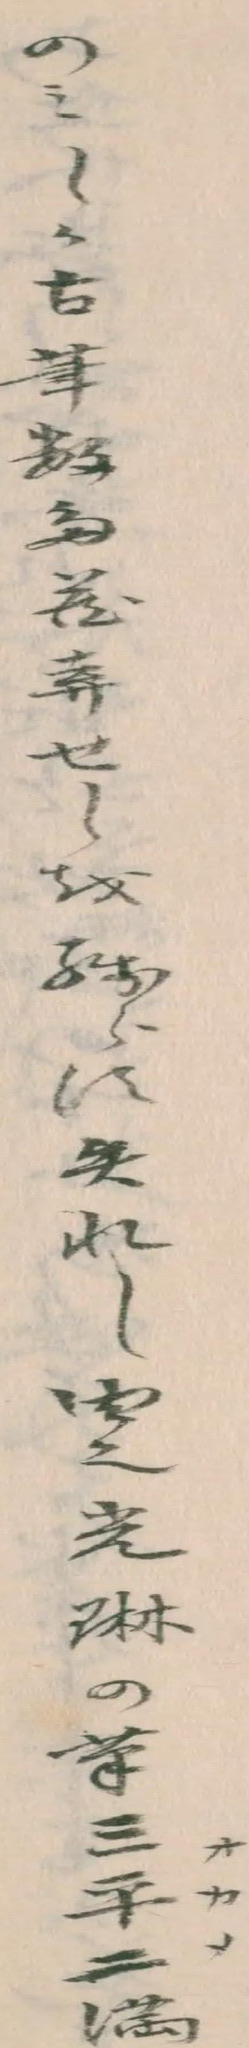のみしか古筆数多蔵弆せしを残らす失れし由也光琳の筆三平二満
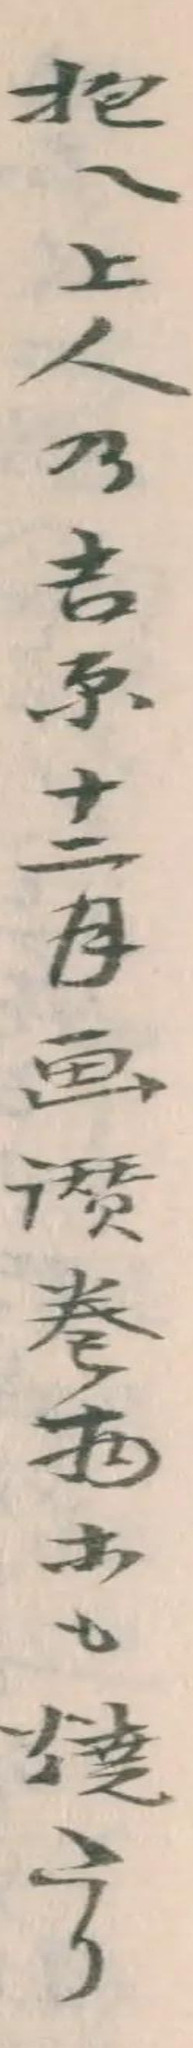抱へ上人の吉原十二月画賛巻物等も焼たり
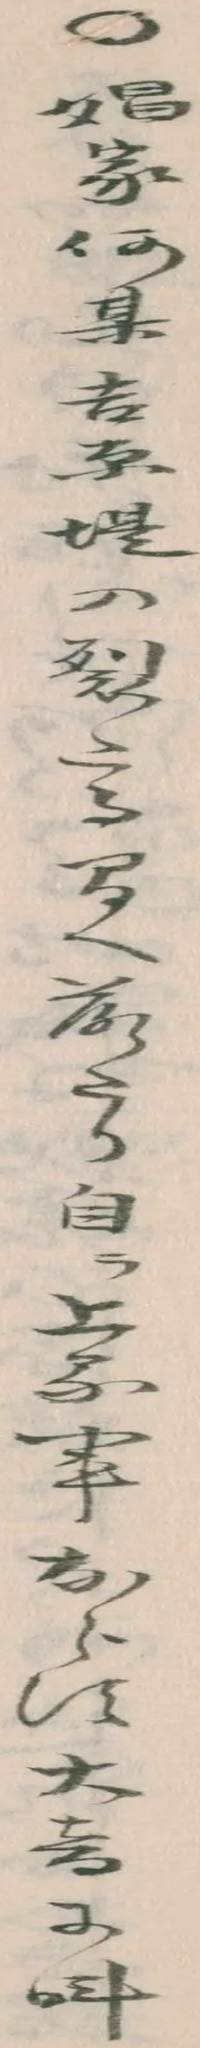〇娼家何某吉原堤の裂けたる間へ落たり自上る事ならす大音に叫
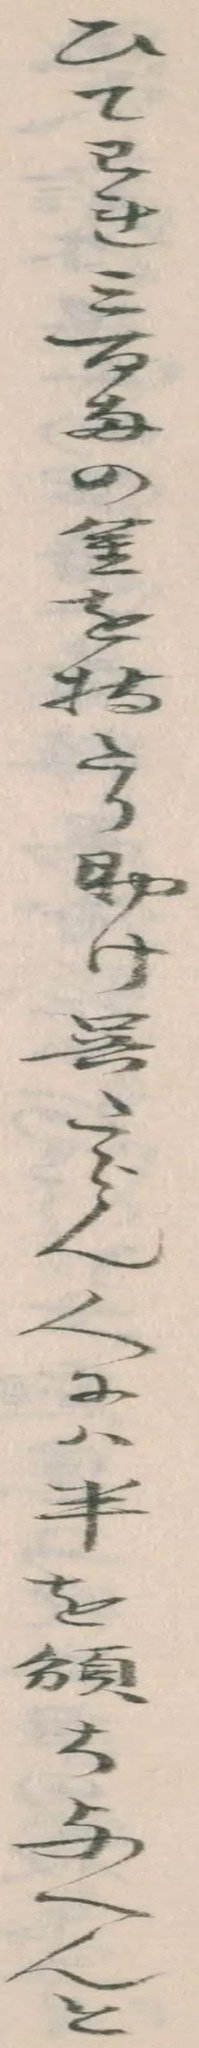ひてわれ三百両の金を持たり助て呉たらん人には半を頒ち与へんと
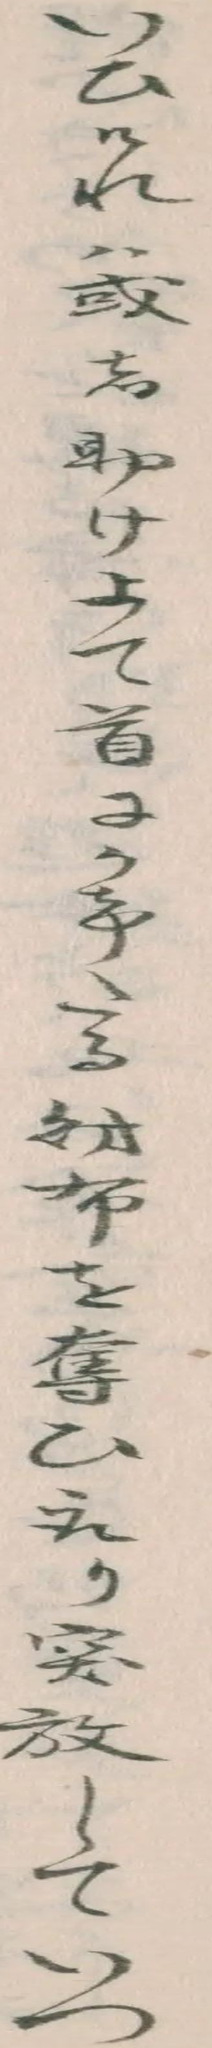いひけれは或者助けよて首にかけたる財布を奪ひ取り突放していつ
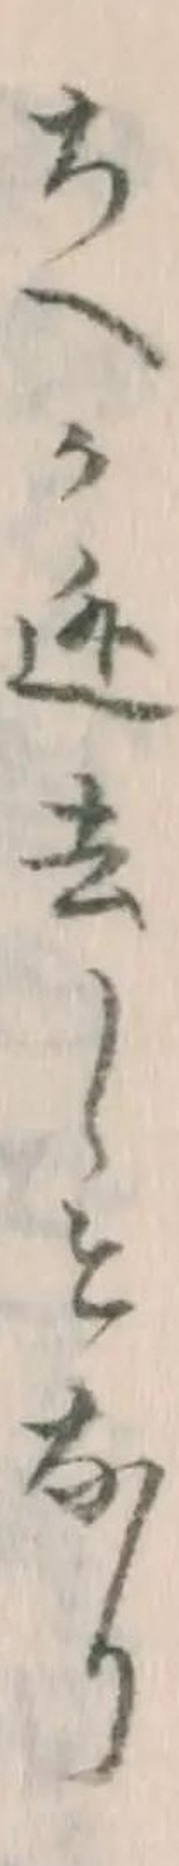ちへか逃去しとなり
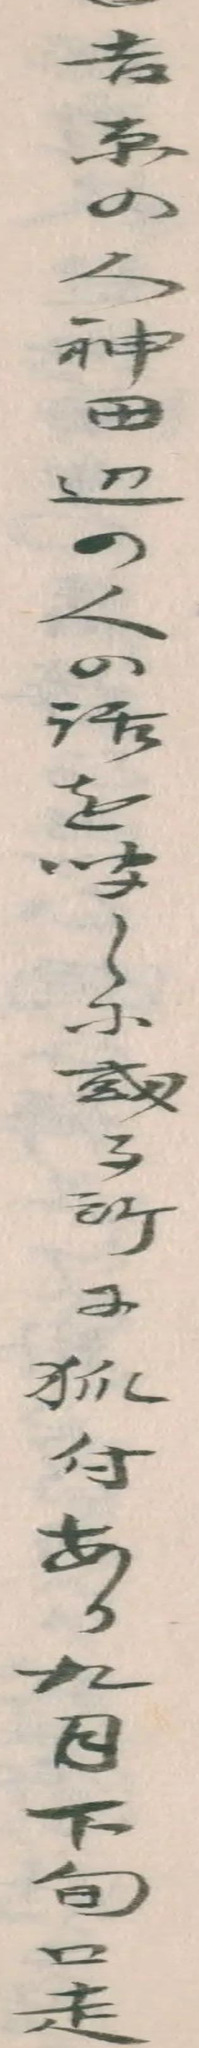〇吉原の人神田辺の人の話を聞しに或る所に狐付あり九月下旬口走
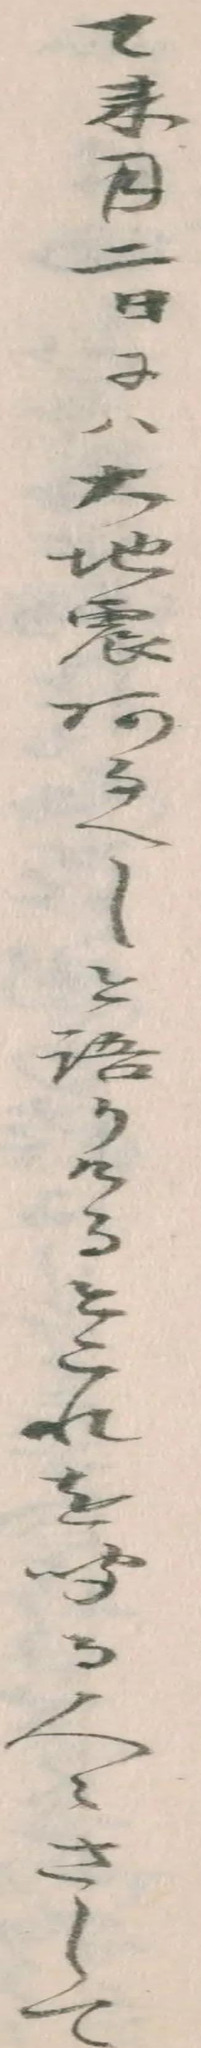て来月二日には大地震あるへしと語りけるとこれを聞る人々さして
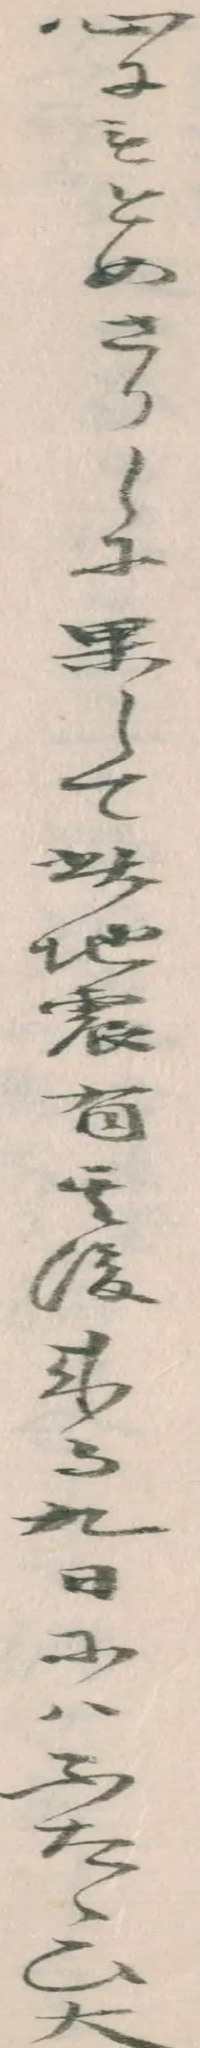心にもとめさりしに果して此地震有其後来る九日にはふたゝひ大
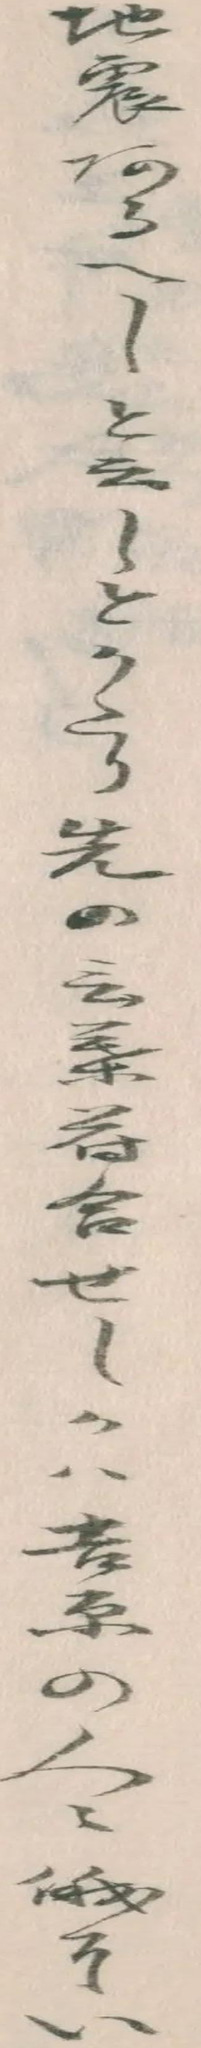地震あるへしと云しとかたり先の言葉符合せしかは吉原の人々俄にい
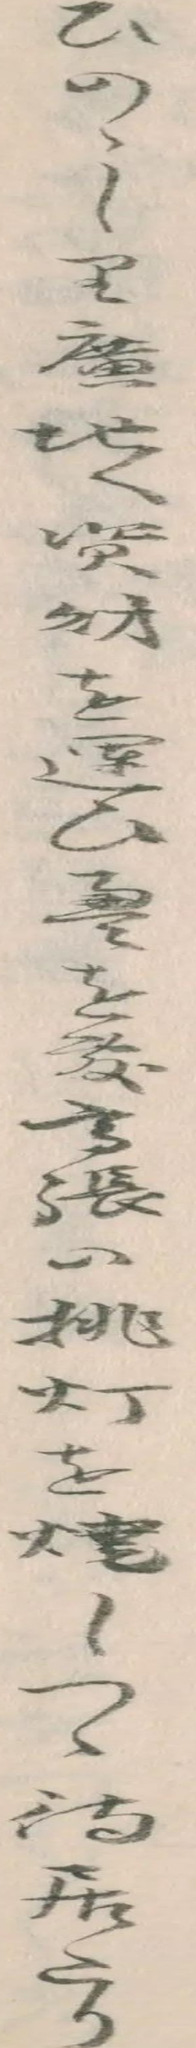ひのゝしり広地へ資財を運ひ畳を敷高張の挑灯を燈しつゝ待居たり

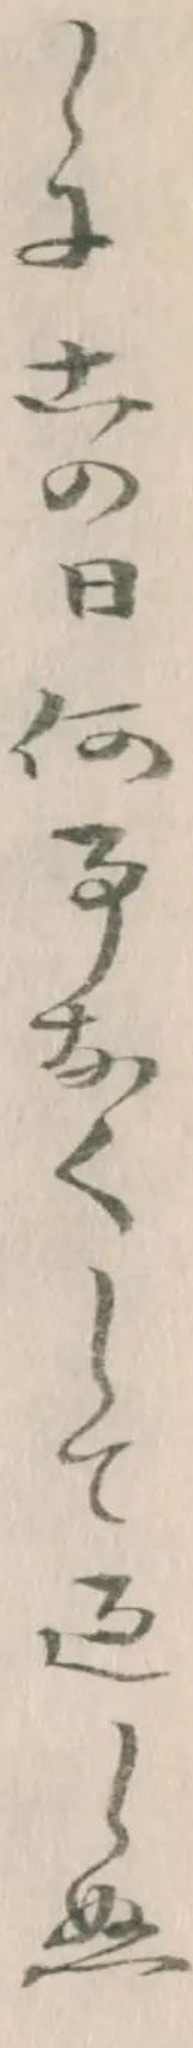しにこの日何事なくして過しぬ
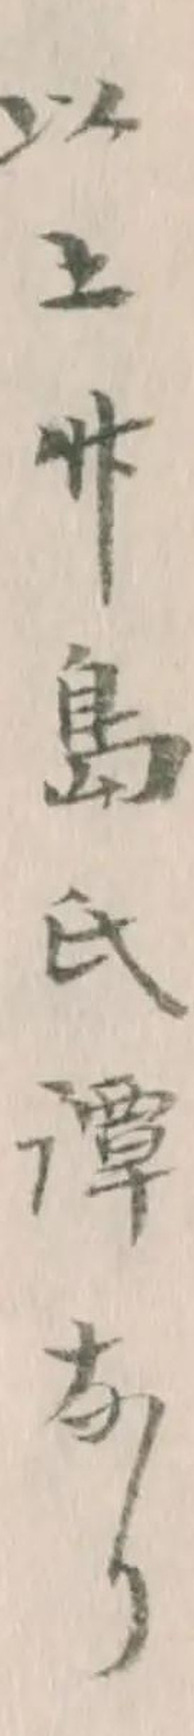以上竹島氏譚なり
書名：地災撮要. 巻10(地震之部) 上,下
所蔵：国立国会図書館 National Diet Library, JAPAN
